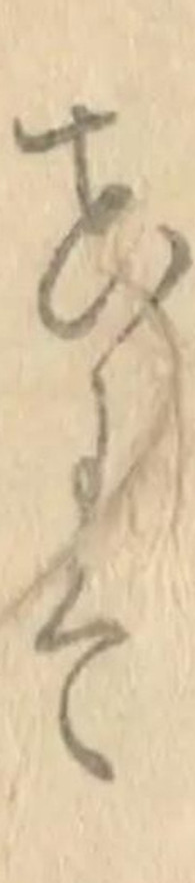花にそ
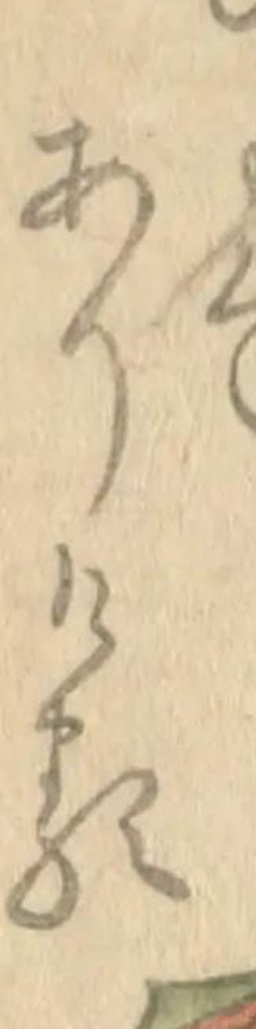ありける

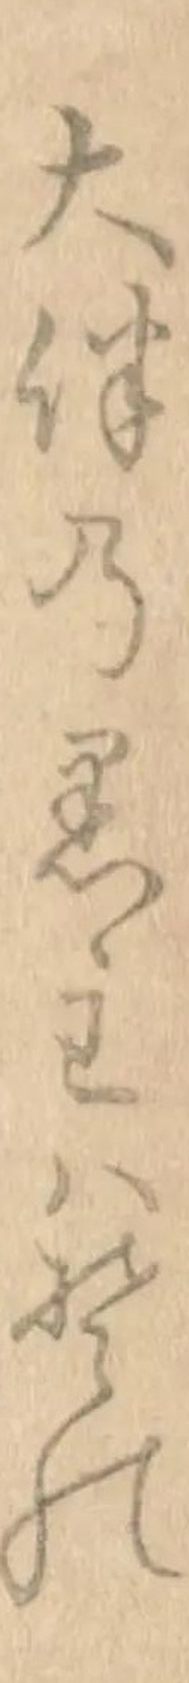大伴の黒主はその
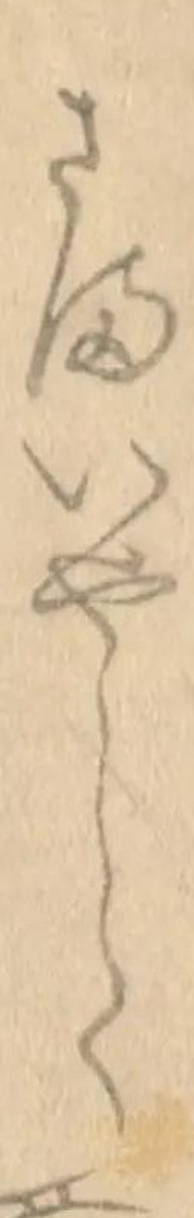さまいやしく
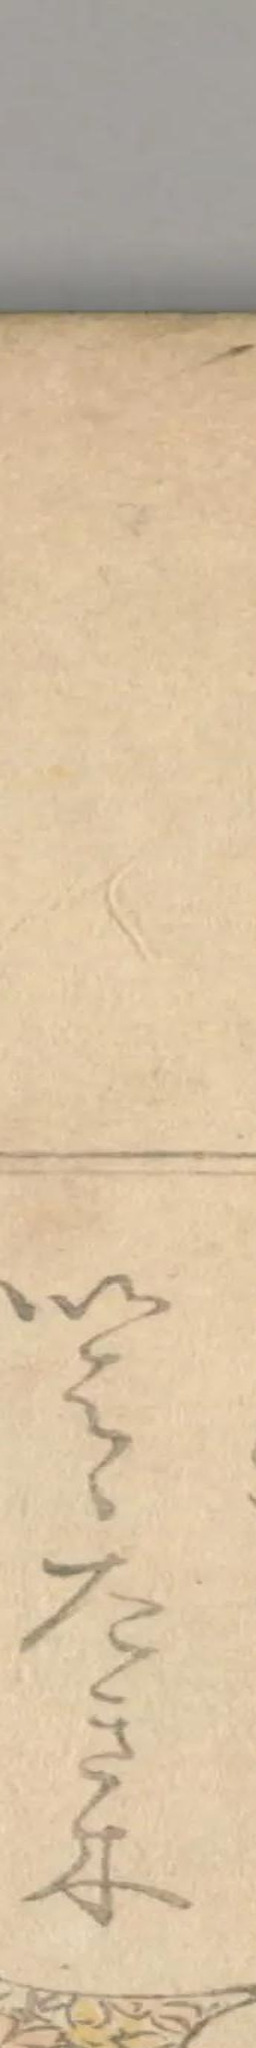いはゝたき木
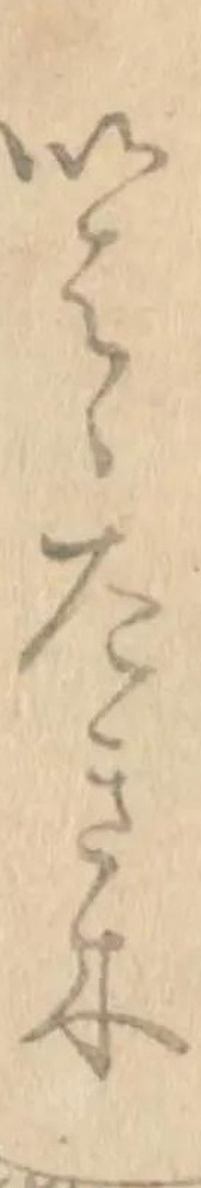いはゝたき木
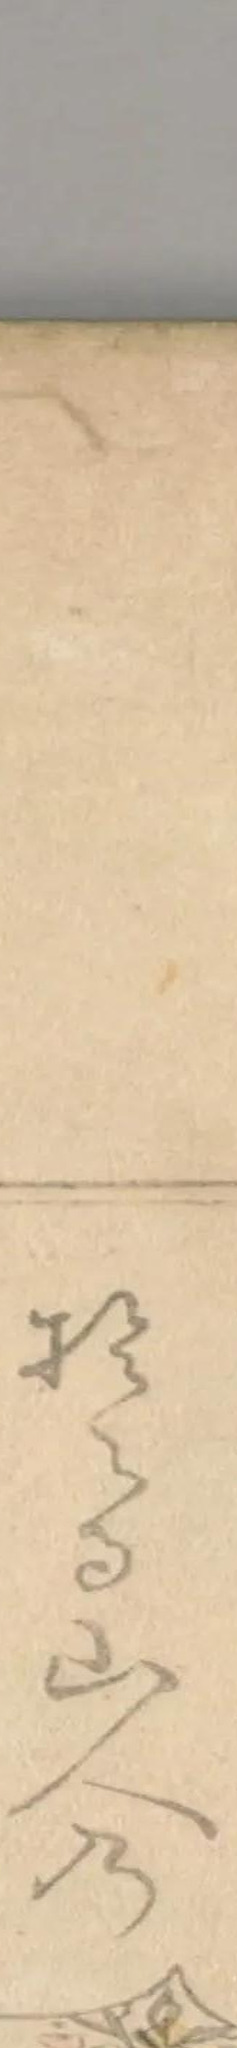おへる山人の
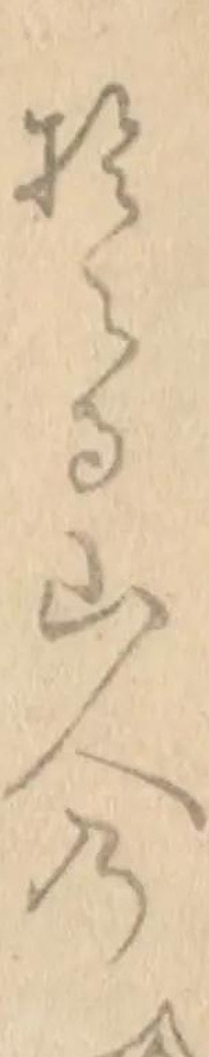おへる山人の
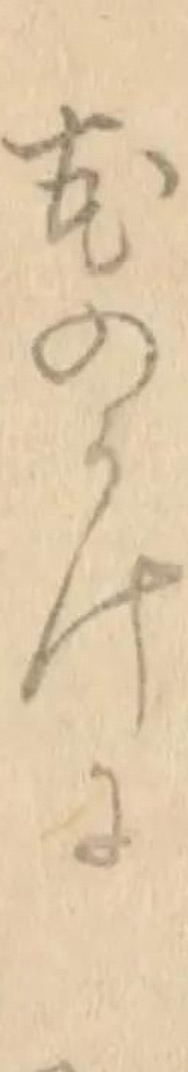花のかけに
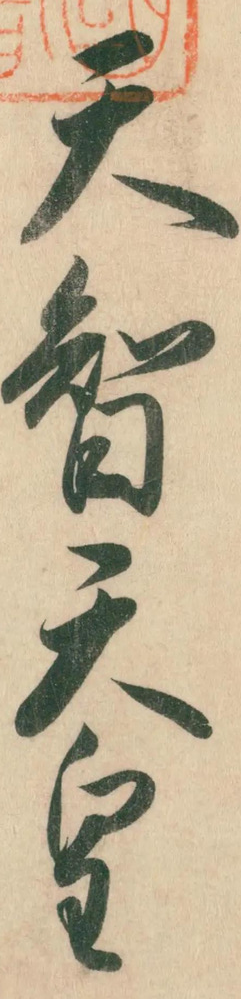天智天皇
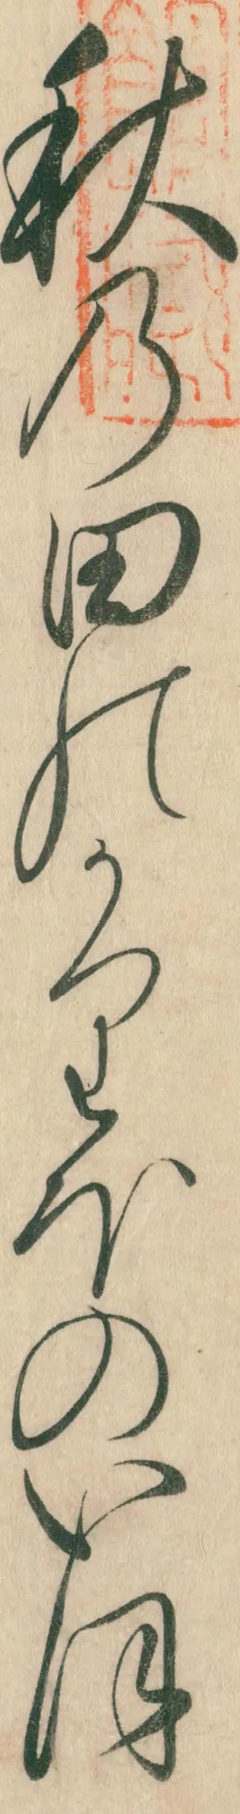秋の田のかりほのいほ
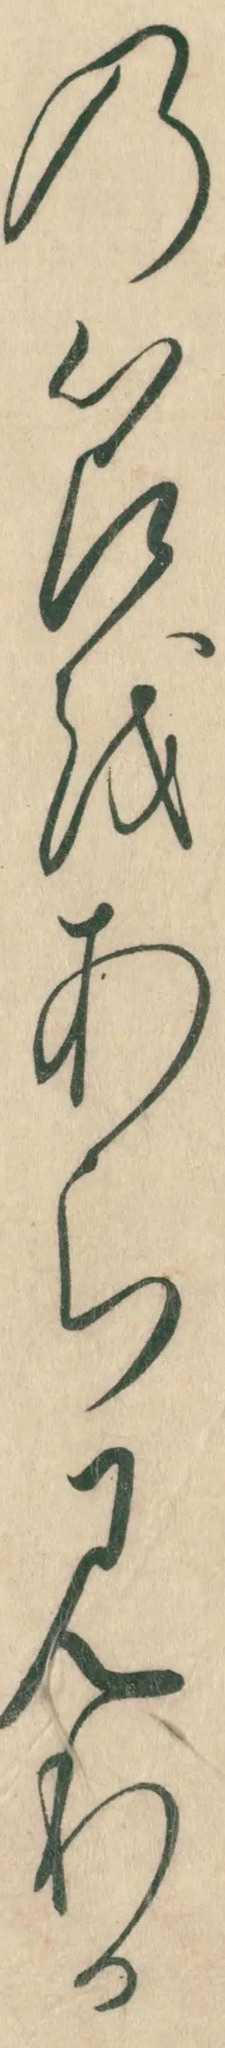の苫をあらみわか
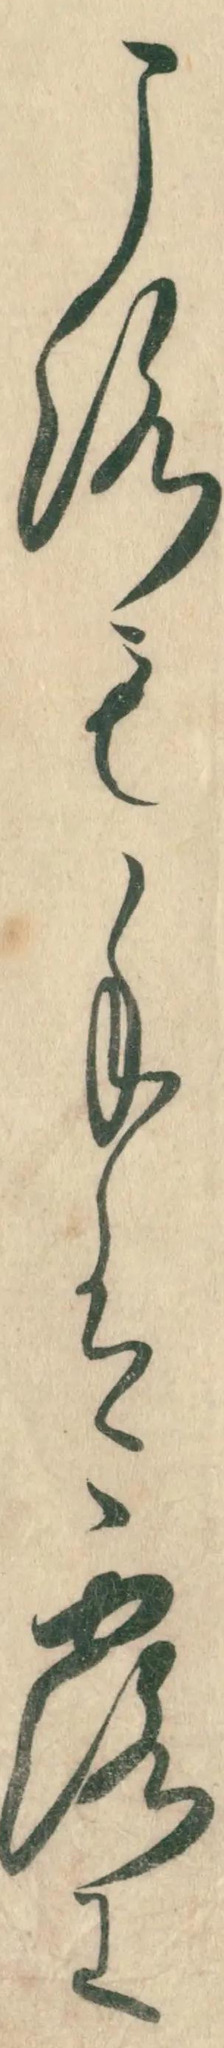ころもては露い
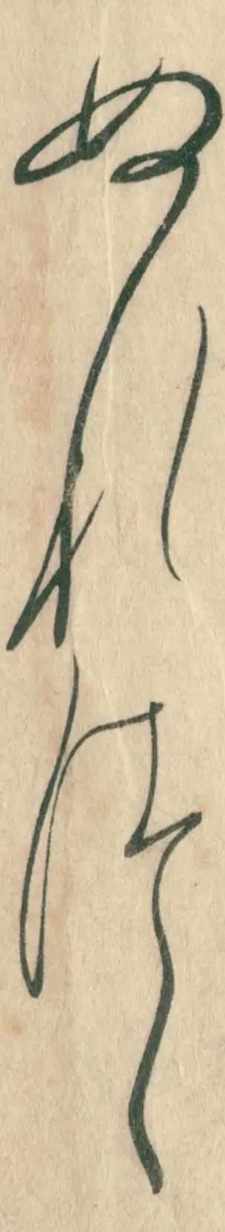ぬれつゝ

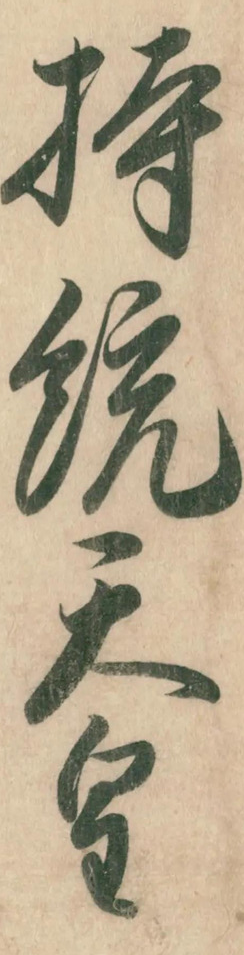持統天皇
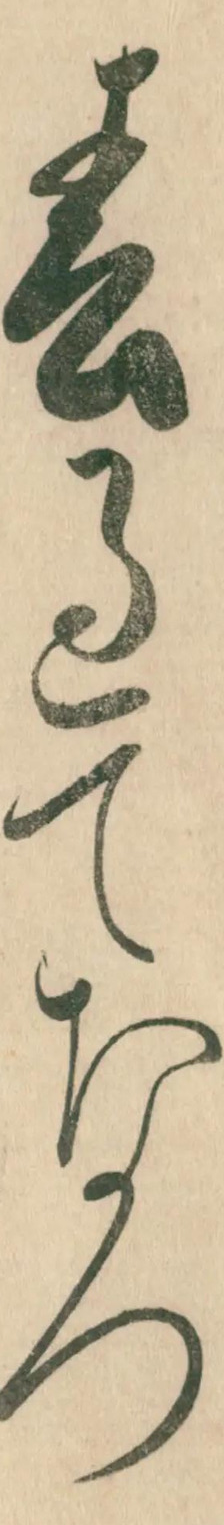春過てなつ
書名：錦百人一首あつま織
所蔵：国立国会図書館 National Diet Library, JAPAN
